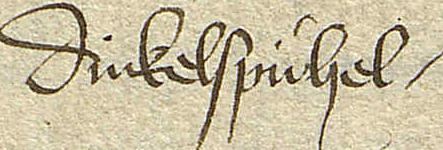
Dinkelſpühel /
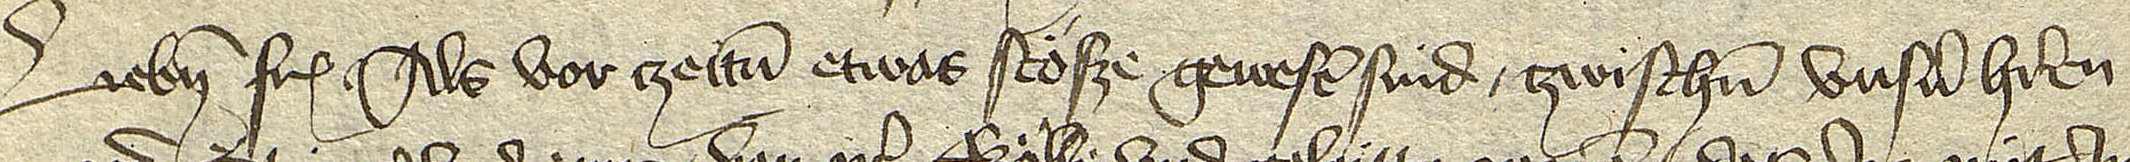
Liebn* fr* / Als vor cʒeitn* etwas ſtöſʒe geweſe* ſind / cʒwiſchn* vnſn* hr*en
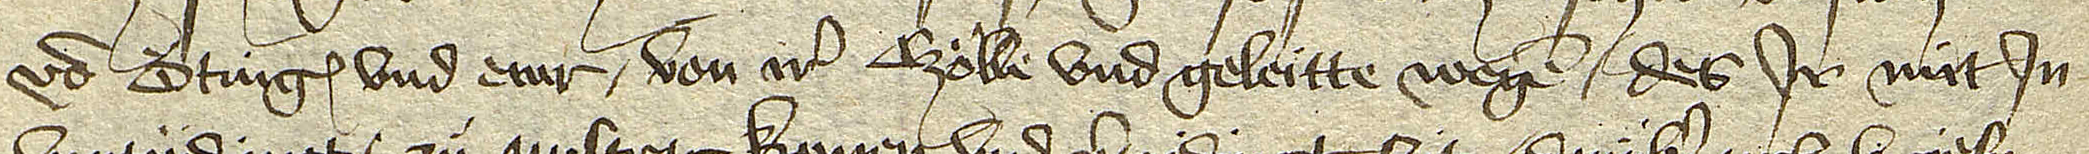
vo* Öting* vnd ewr / von ir* Cʒölle vnd geleitte wege* / des Ir mit In
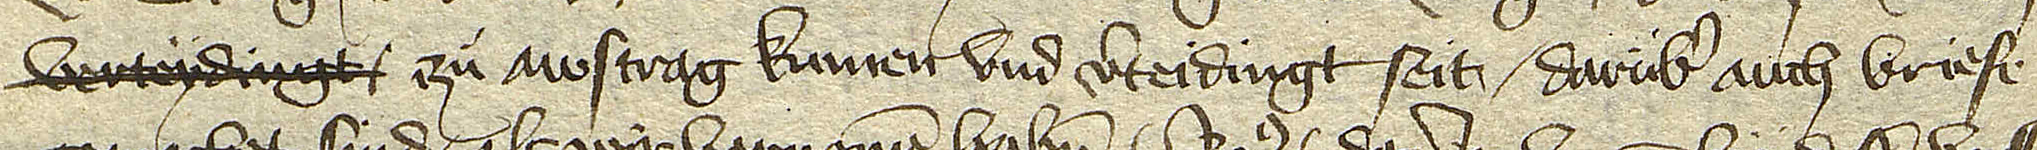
verteydingt / cʒü awſtrag kumen vnd v*teidingt ſeit / darüb* auch briefe
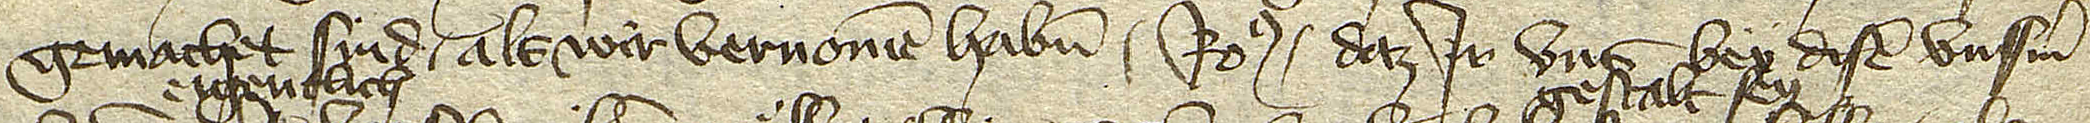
gemachet ſind / als wir vernome* habn* / Ro* / daʒ Ir vns bey diſe vnſm*
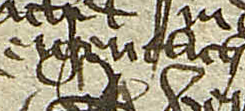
eigentlich
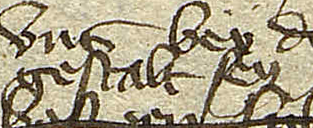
geſtalt ſey
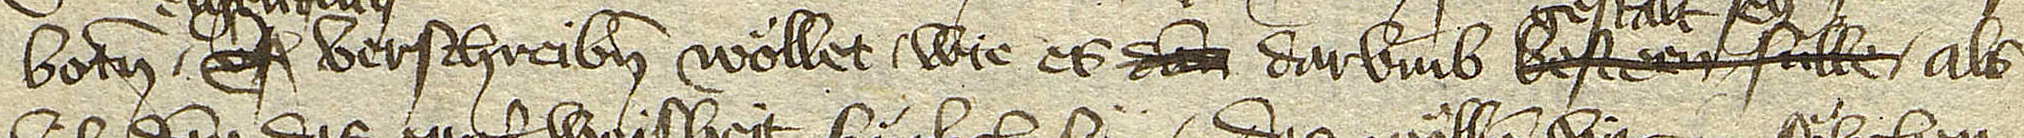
botn* / v* verſchreibn* wöllet / wie es dan* darvmb beſteen ſülle / als
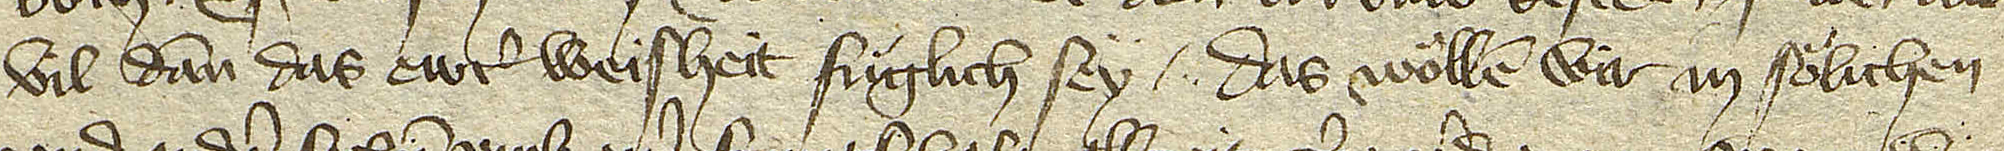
vil dan* das ewr* weiſheit füglich ſey / Das wölle* wir in ſölichen
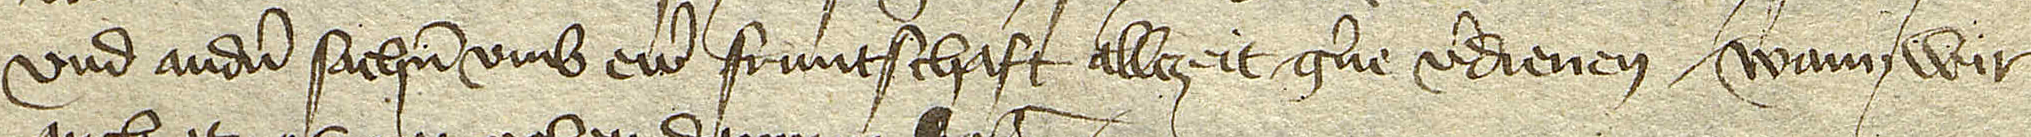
vnd andn* ſachn* vmb ew* fruntſchaft allcʒeit / g*ne v*dienen / wann wir
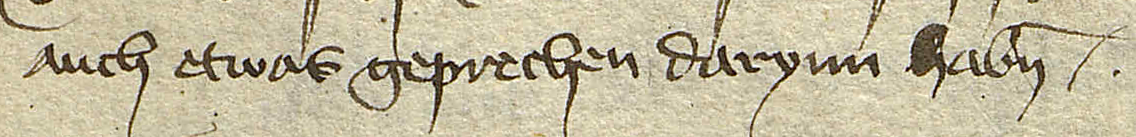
auch etwas geprechen darynn habn* / .
